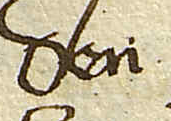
den
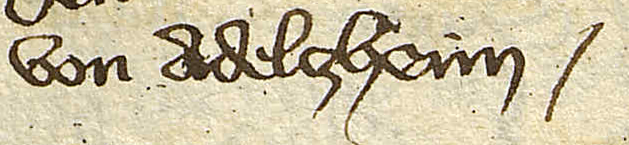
von Adelcʒheim /
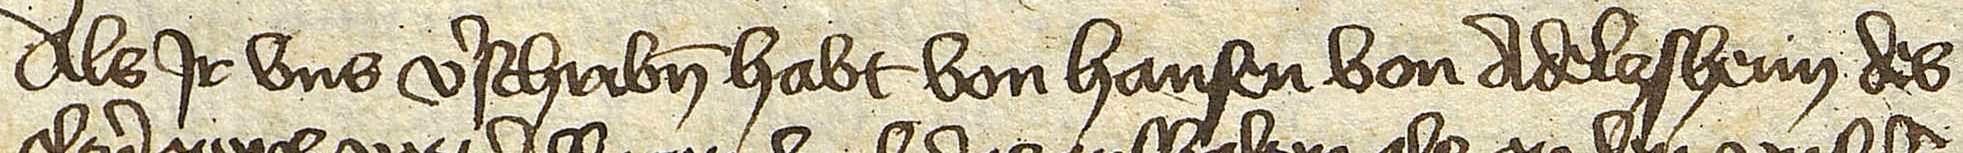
Als Ir vns v*ſchribn* habt von hanſen von Adelcʒſheim des
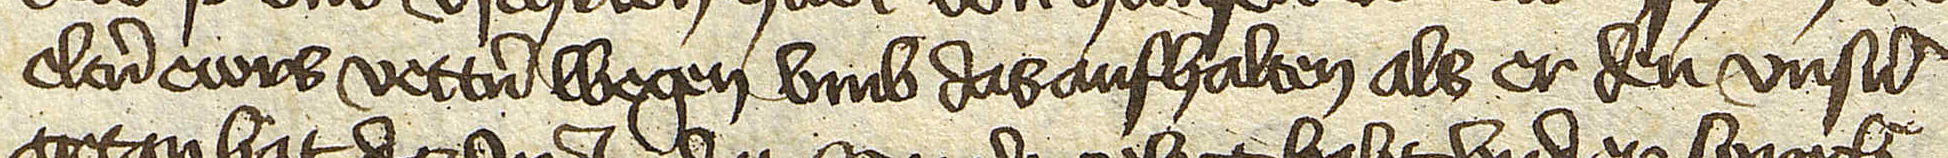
eltn* ewrs vettn* wegen vmb das aufhalten als er den vnſn*
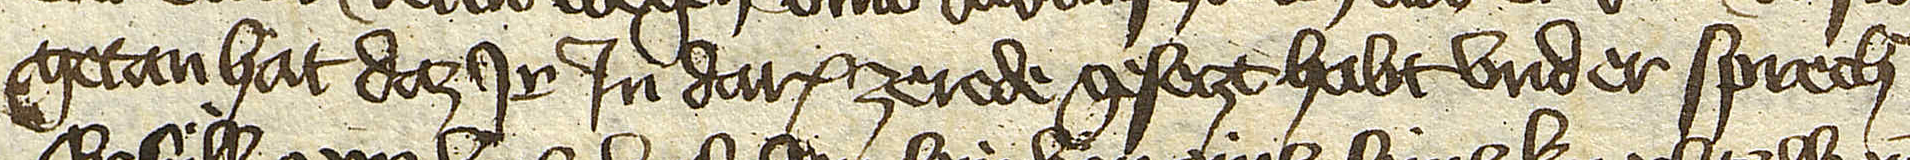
getan hat daʒ Ir In dar* cʒerede geſecʒt habt vnd er ſprech
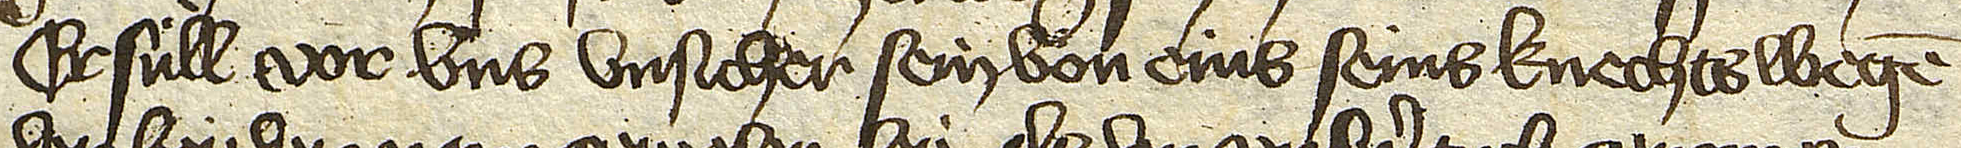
Er ſüll vor vns vnſicher ſein von eins ſeins knechts wege*
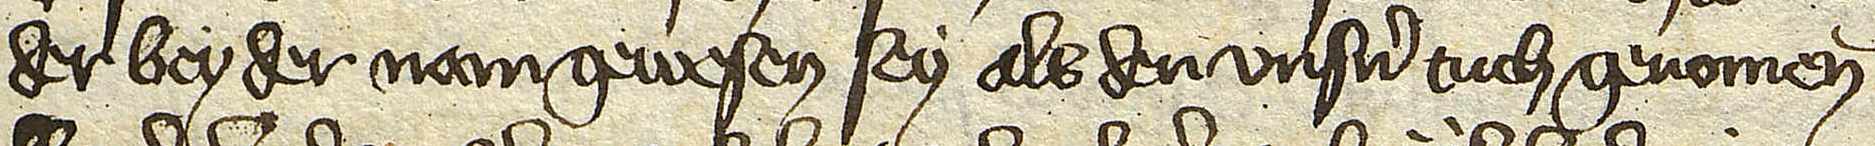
der bey der nam geweſen ſey als den vnſn* tuch genomen
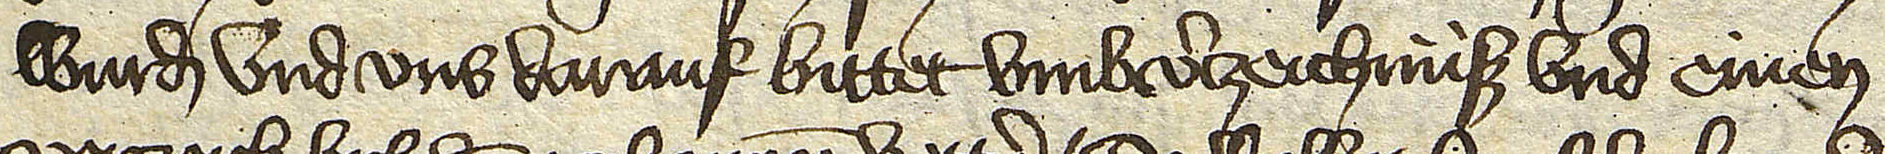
wurd vnd vns darauf bittet vmb v*cʒeichnüſʒ vnd einen
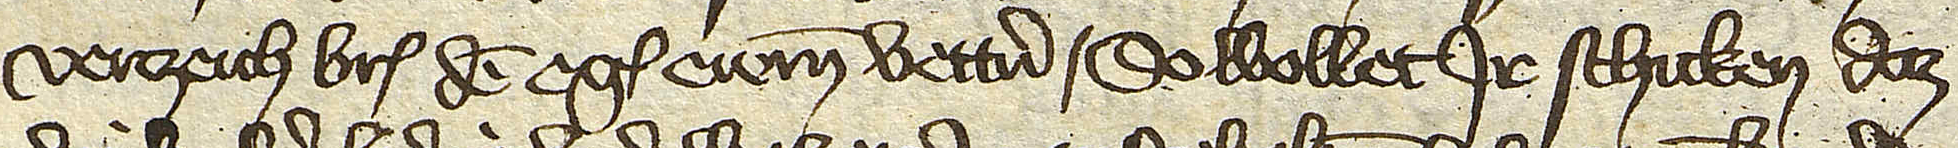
vercʒeich br* de* eg* ewrn* vettn* / So wollet Ir ſchicken daʒ
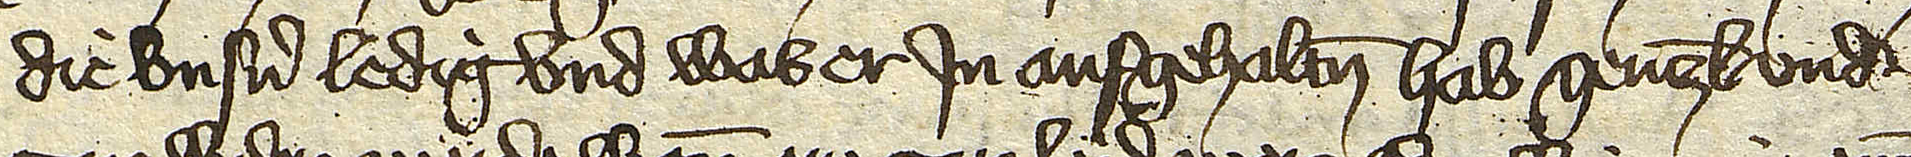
die vnſn* ledig vnd was er In aufgehaltn* hab gencʒl* vnd
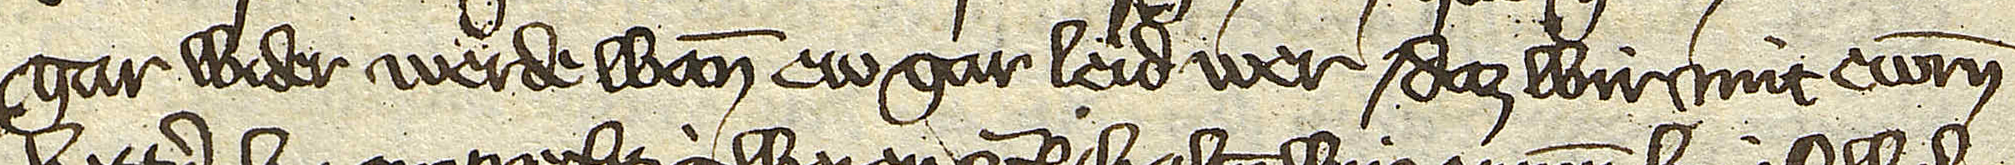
gar wider werde wan* ew gar leid wer / daʒ wir mit ewrn*
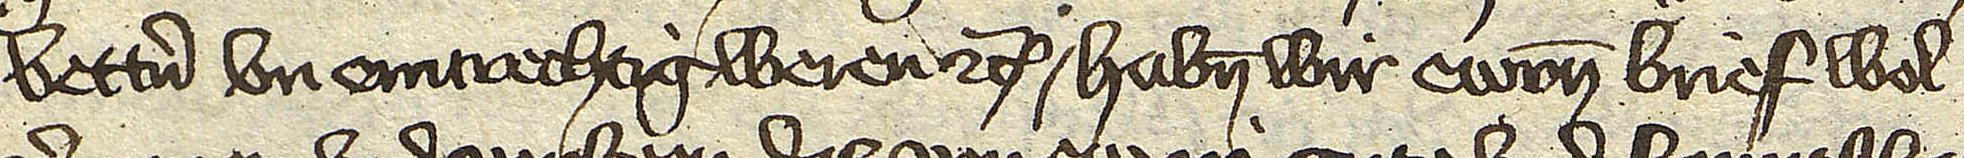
vettn* vn eintrechtig weren ec* / habn* wir ewrn* brief wol
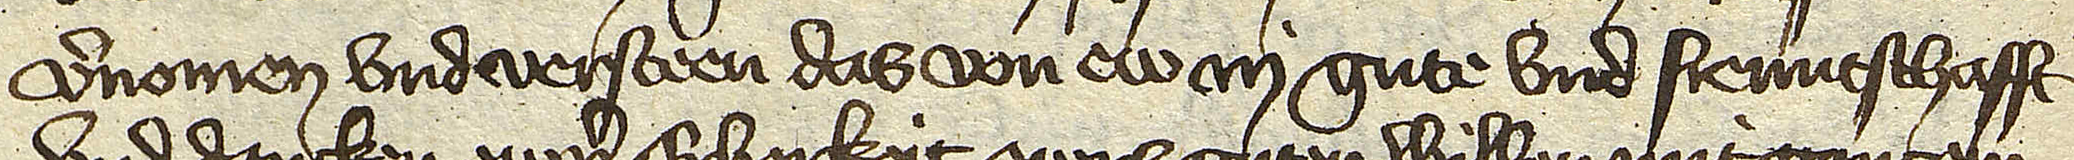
v*nomen vnd verſteen das von ew in gute vnd freuntſchafft
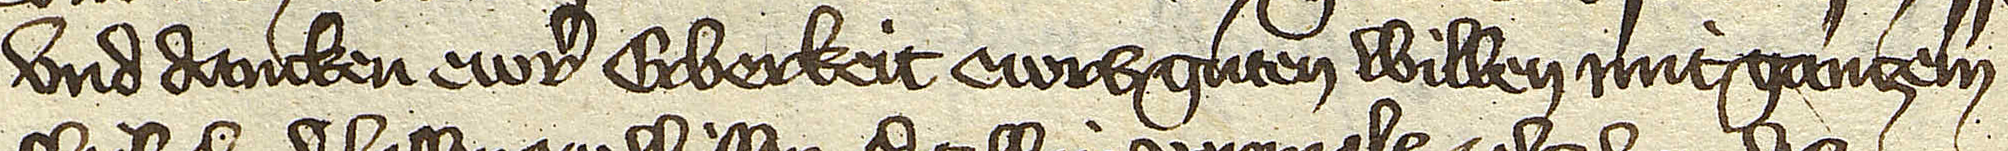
vnd dancken ewr* Erberkeit ewrs guten willen mit gancʒem
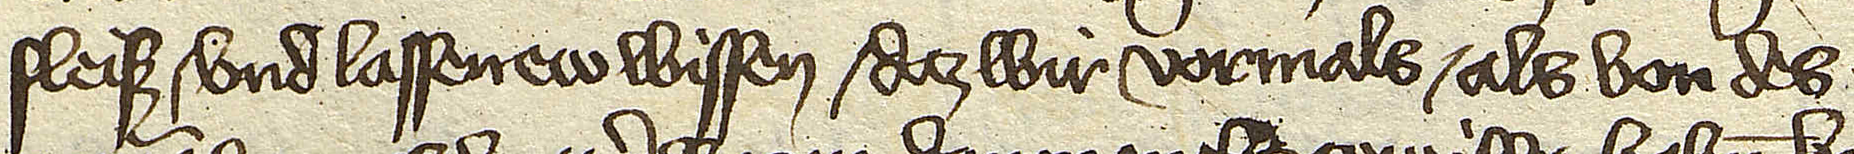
fleiſʒ / vnd laſſen ew wiſſen / daʒ wir vormals / als von des
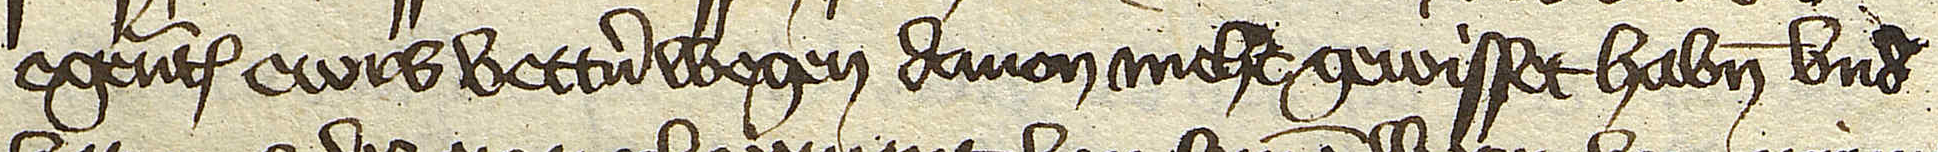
egen*t* ewrs vettn* wegen dauon nicht gewiſſet habn* vnd
